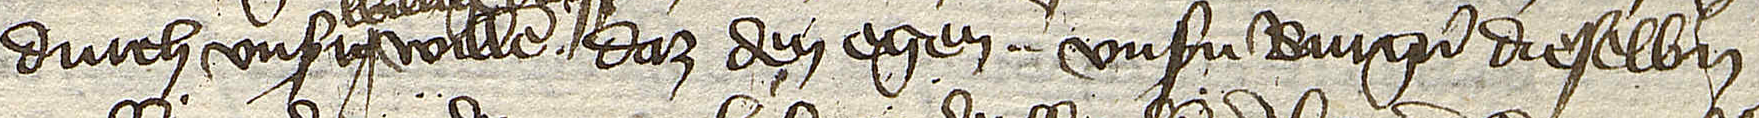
durch vnſ*n wille* . daʒ den egen* ~ vnſ*n Burgn* dieſelbn*
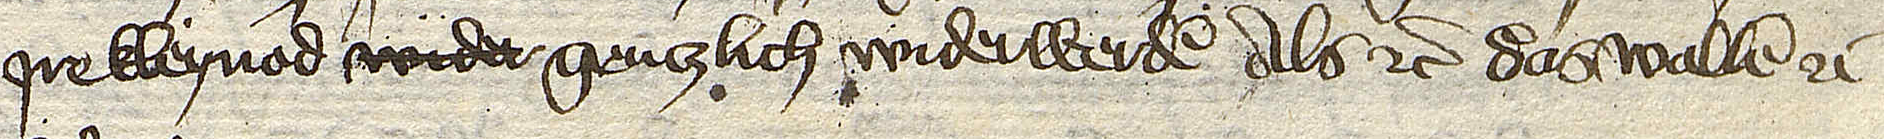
Ire kleynod wider gencʒlich widerwerde* Als ec* das wolle* ec*
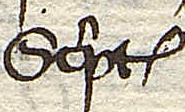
Sc*pt*
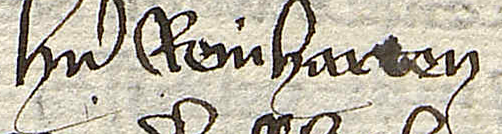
hn* Reinharten
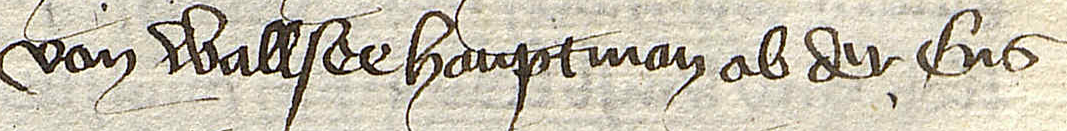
von Wallſee hauptman ob der Ens
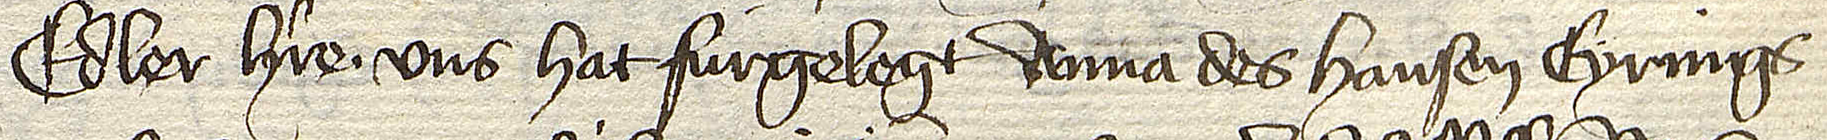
Edler h*re . vns hat fürgelegt Anna des hanſen Eyrings
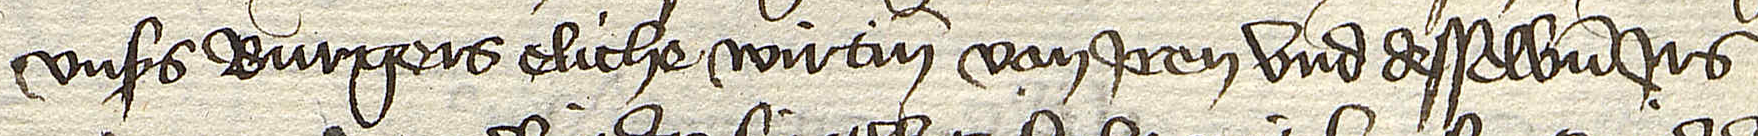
vnſ*s Burgers eliche wirtin* von Iren vnd deſſelbn* Irs
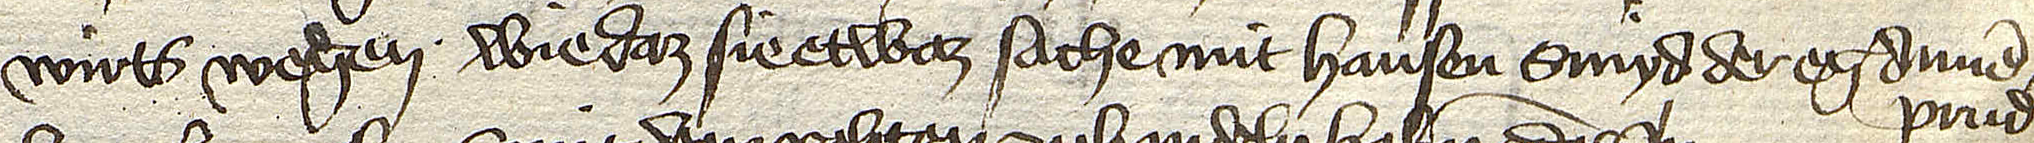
wirts wegen . wie daʒ ſie etwaʒ ſache mit hanſen Smyd der eg* Anne*
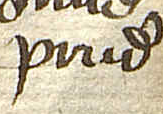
prud*
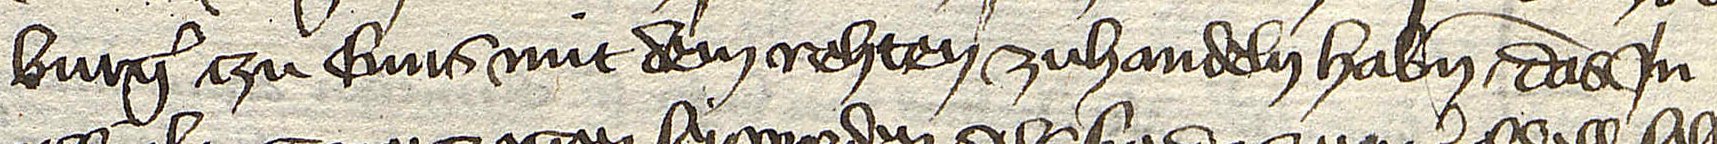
burg* cʒu Ems mit dem rehten cʒuhandeln habn* / das In
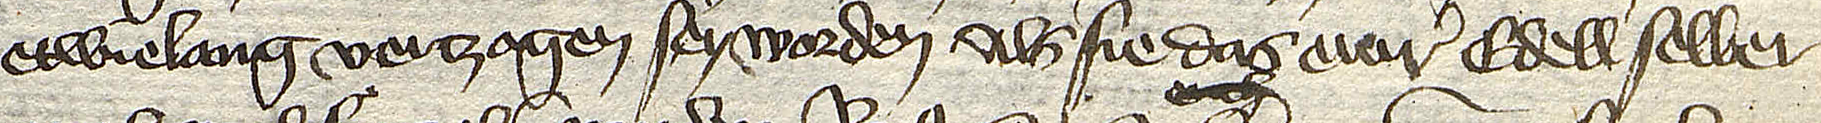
etwielang vercʒogen ſey worden / Als ſie das ewr* Edell ſelber
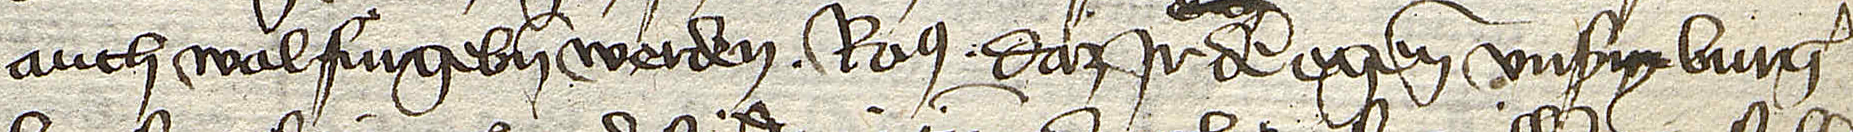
auch wol fürgebn* werden . Ro* . Daʒ Ir de* egen* vnſ*m burg*
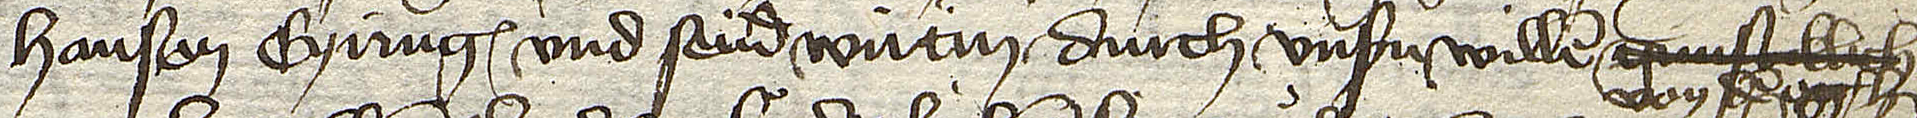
hanſen Eyring* vnd ſein* wirtin* / durch vnſ*n wille* gunstiklich
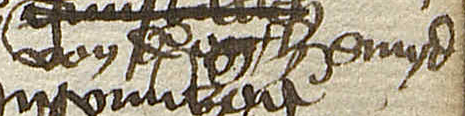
von de* eg* h* Smyd
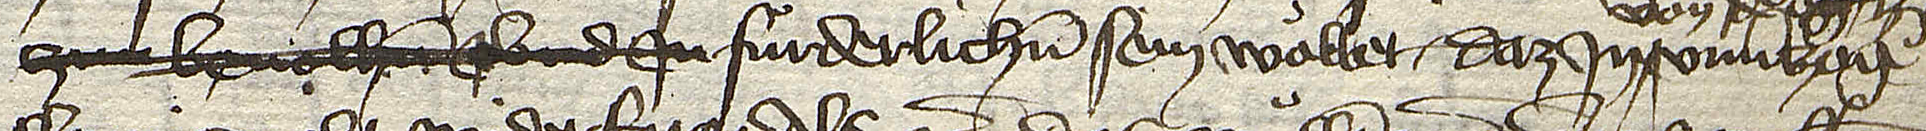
cʒum beuolhn* I vnd In fürderlichn* ſein wöllet / daʒ In vnu*cʒoge*
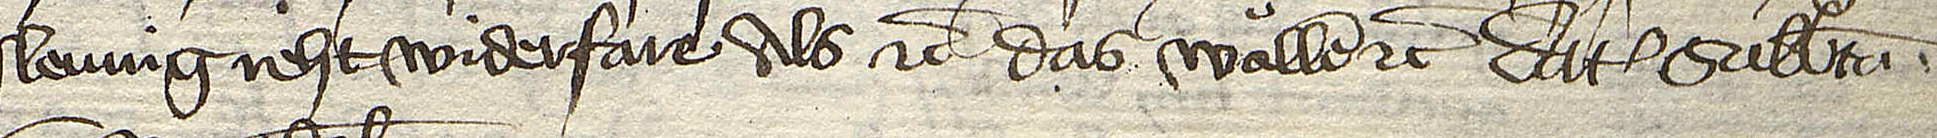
ſleunig reht widerfare Als ec* das wölle* ec* Dat* Sabbto*
